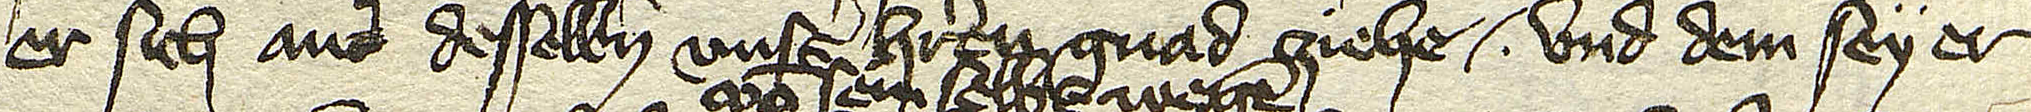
er ſich an* deſſelbn* vnſs* hr*en gnad cʒiehe / . vnd dem ſey er
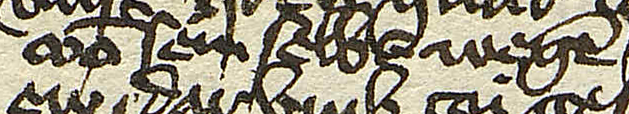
vo* ſein ſelbs wege*
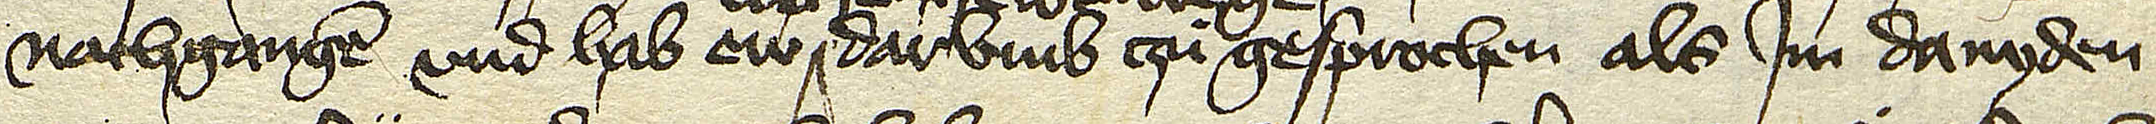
nachgange* vnd hab ew darvmb cʒü geſprochen als Im danyden
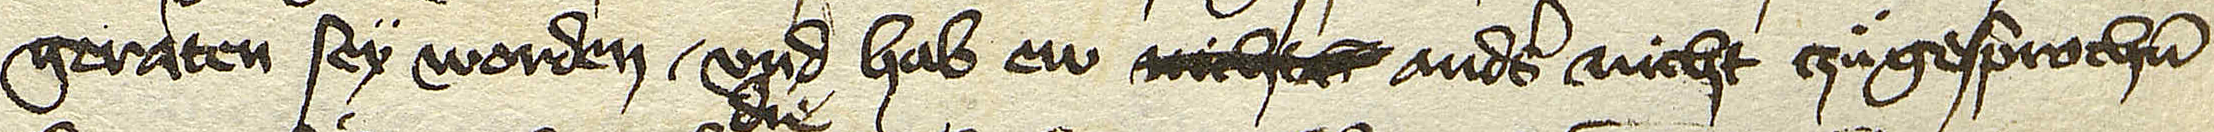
geraten ſey worden / vnd hab ew nichts ands* nicht cʒügeſprochn*
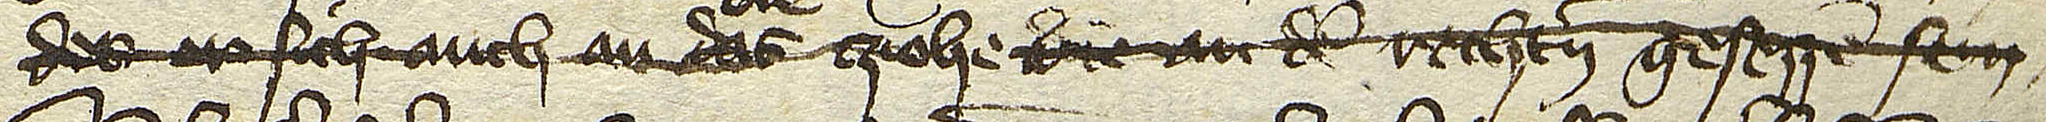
des er ſich auch an das cʒiehe die an d* rechtn* geſeʒʒe* ſein
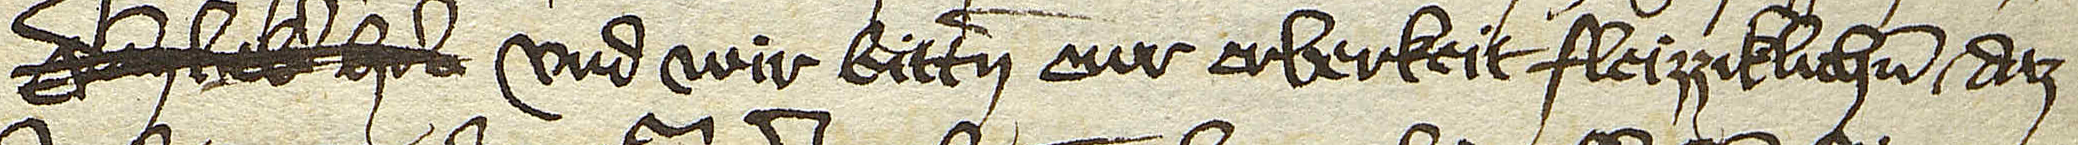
Dan* lieb* hr*e vnd wir bittn* ewr erberkeit fleiʒʒiklichn* / daʒ
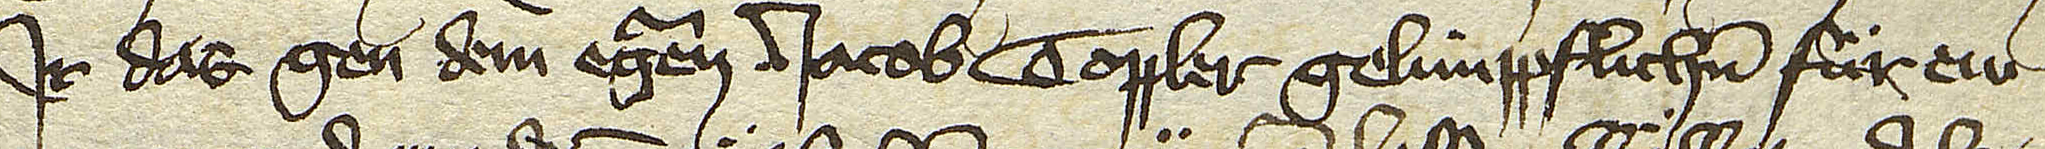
Ir das gen dem egen* Iacob Toppler gelimppflichn* für ew
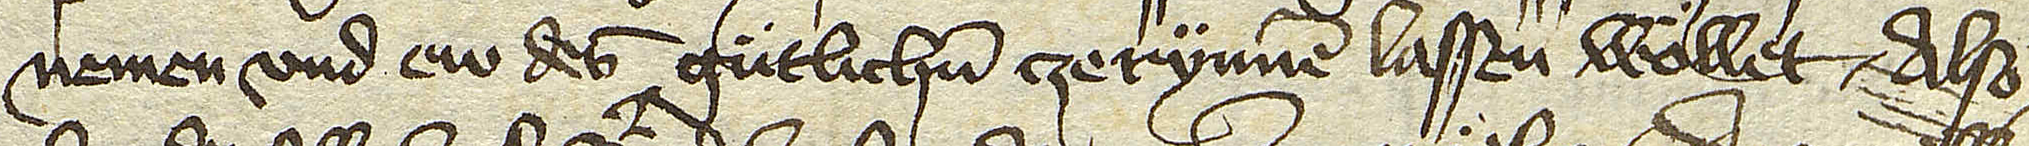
nemen vnd ew des gütlichn* cʒerynne* laſſen wöllet / Alſo
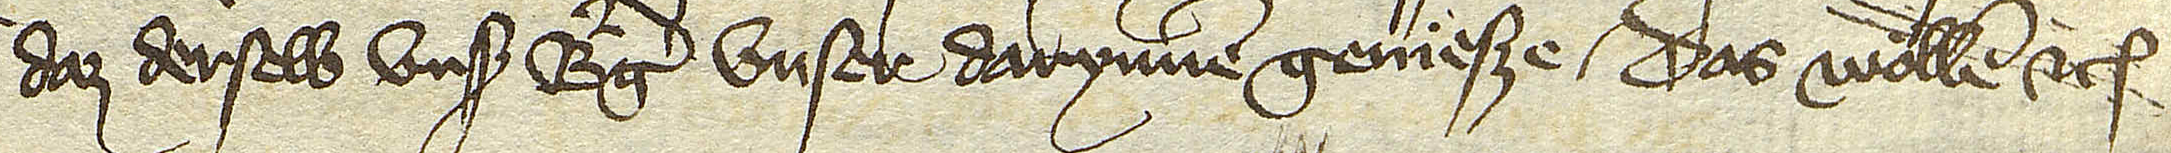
daʒ derſelb vnſ* B*g* vnſer darynne* genieſʒe / Das wölle* ec*
